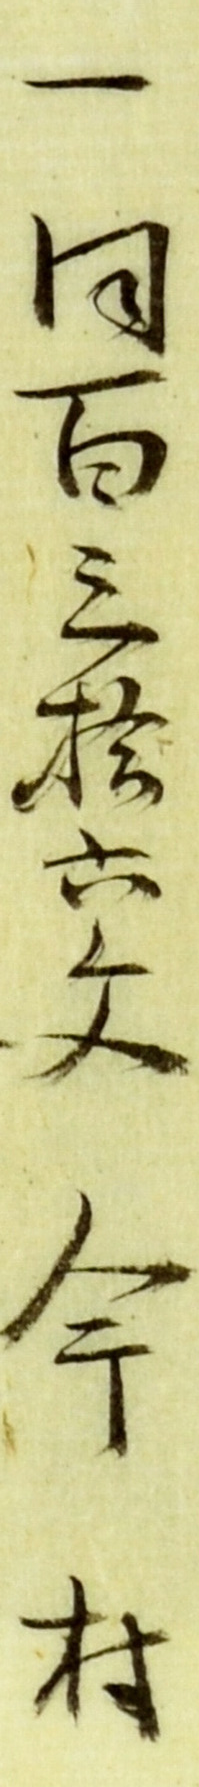一同百七拾弐文渡戸村
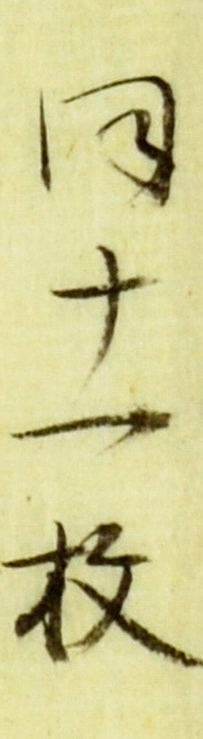同十六枚
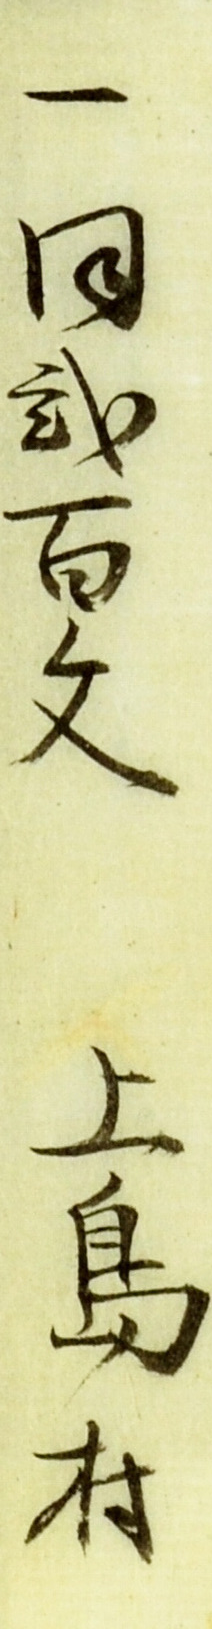一同弐百文上島村
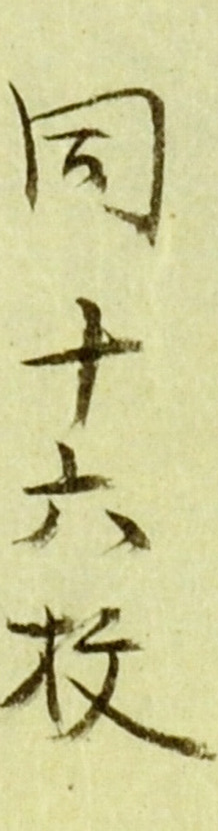同十六枚
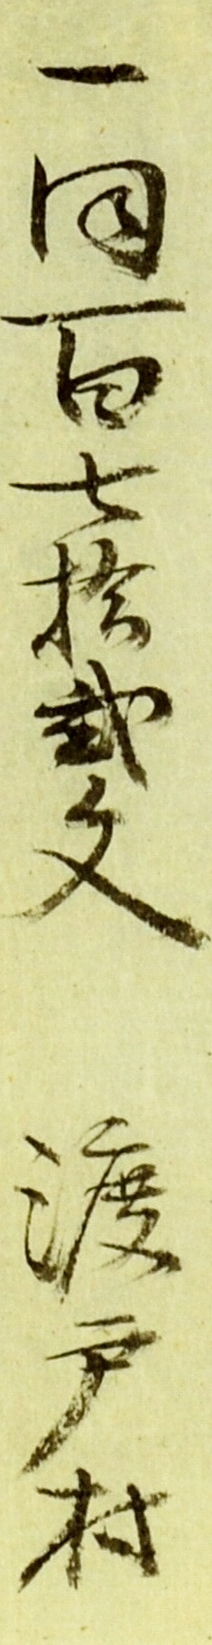一同百七拾弐文渡戸村
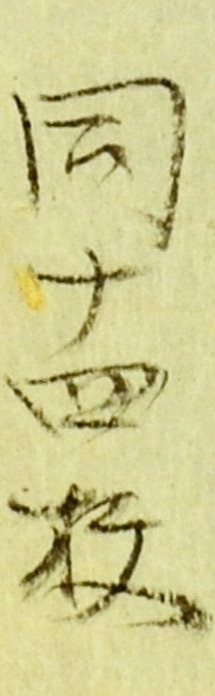同十四枚
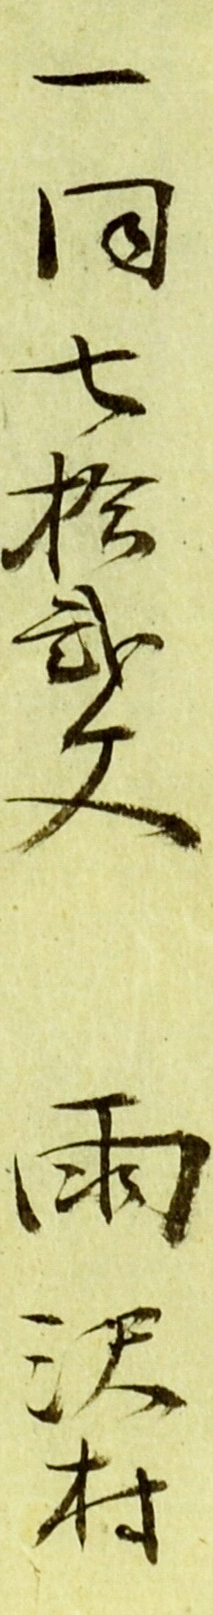一同七拾弐文雨沢村
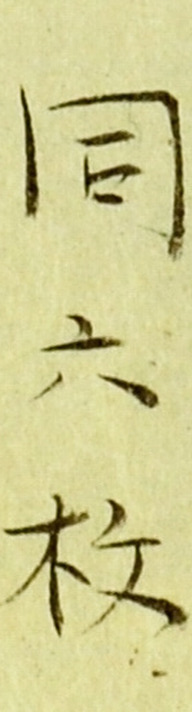同六枚
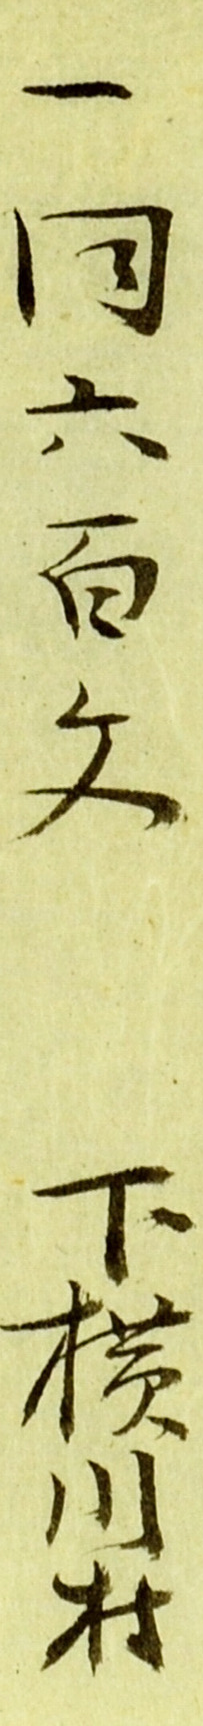一同六百文下横川村
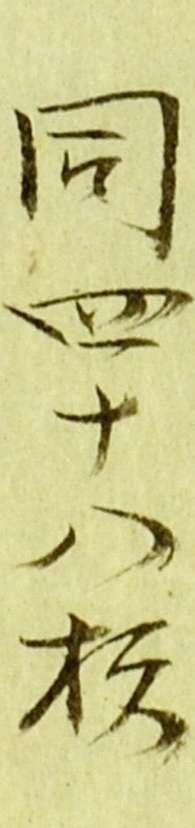同四十八枚
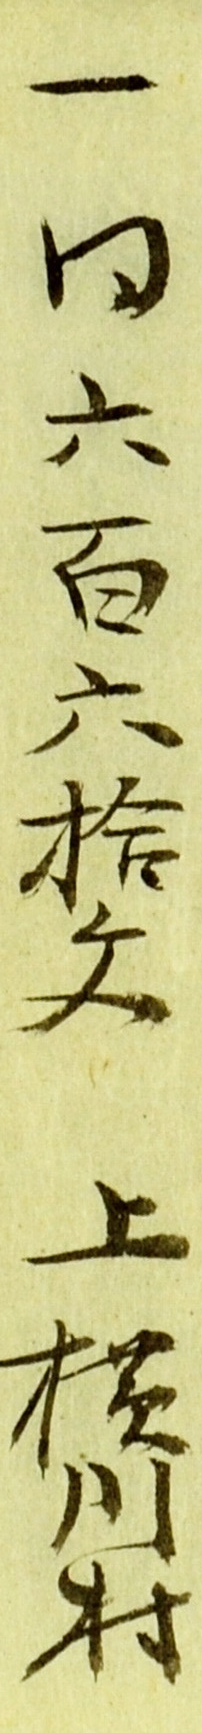一同六百六拾文上横川村
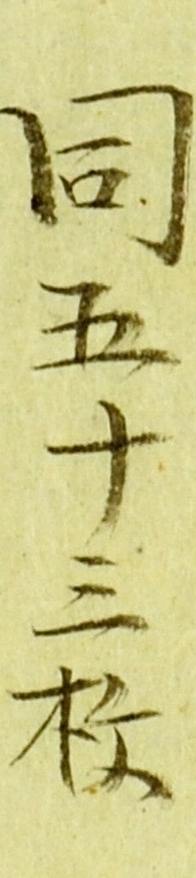同五十三枚
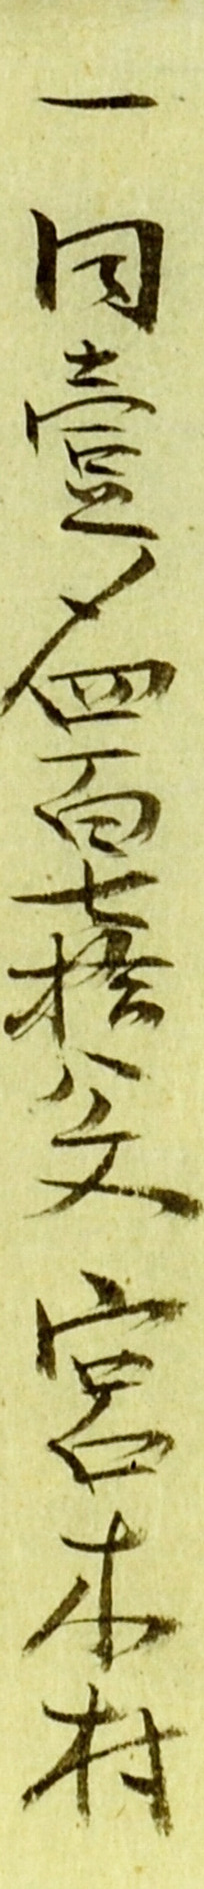一同壱貫四百七拾八文宮木村
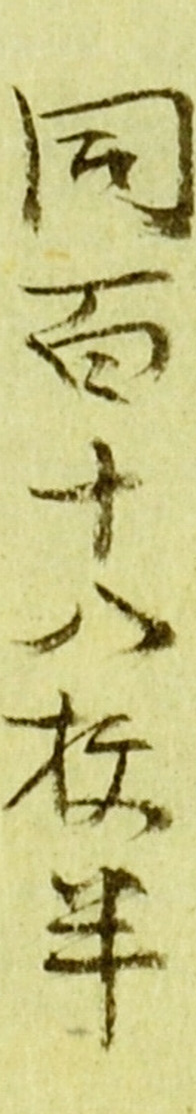同百十八枚半
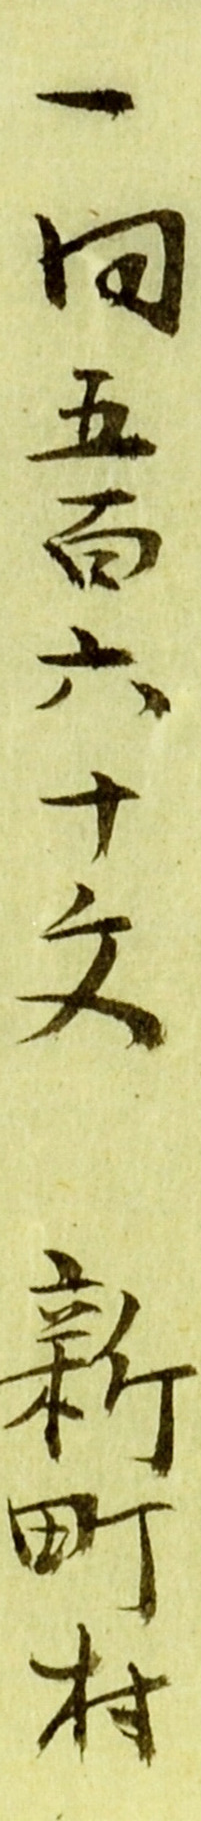一同五百六十文新町村
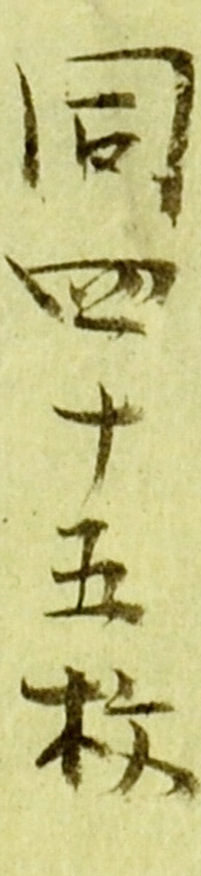同四十五枚
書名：上伊那郷諸運上取調帳
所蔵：伊那市立高遠町図書館・合同会社AMANE
